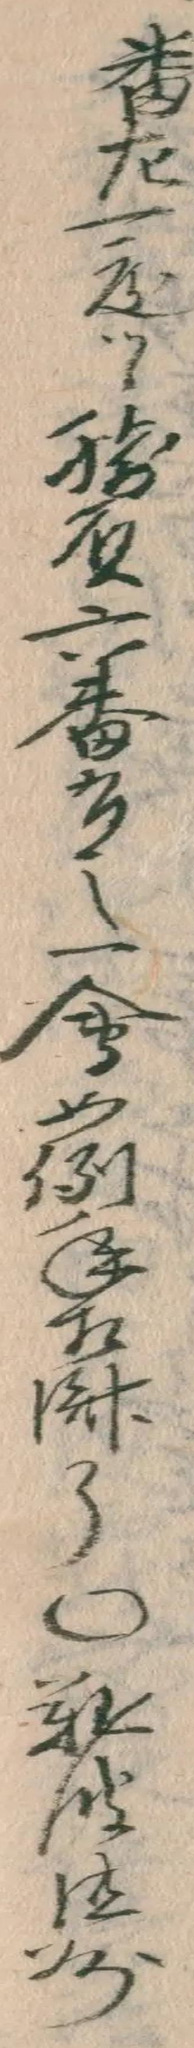番左一度ツヽ勝負六番有之一會如例年相済了○難波信州
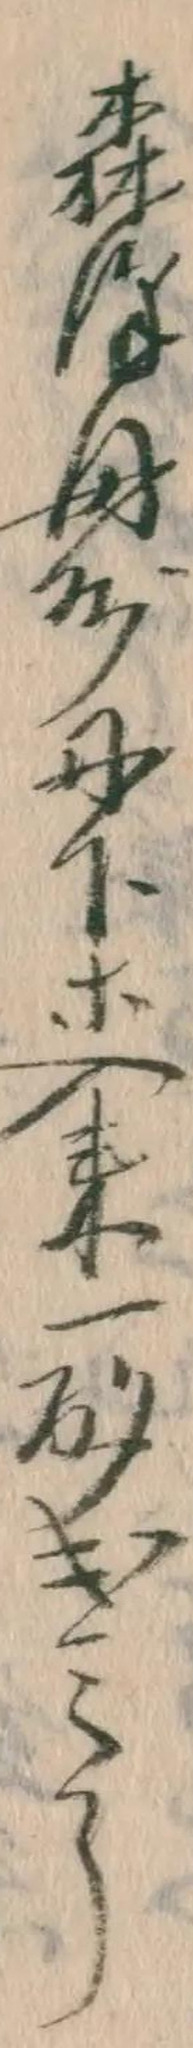森沢丹州丹下等入来一酌出之了
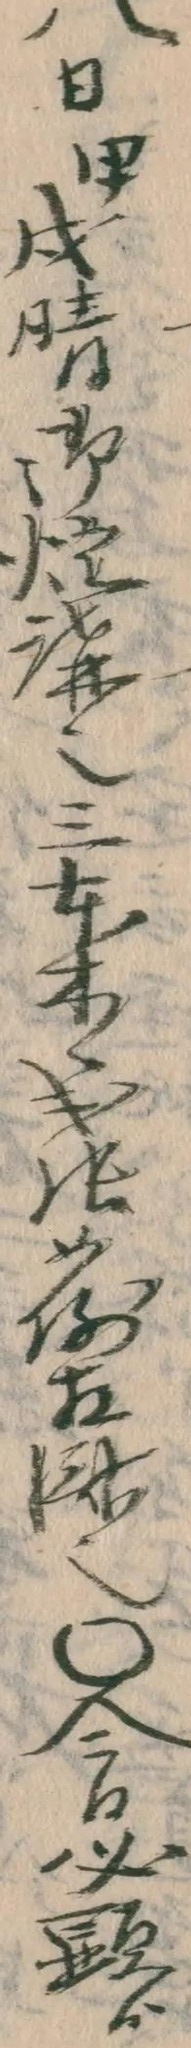八日甲戌晴御燈講也三本木へ出張如例相済也〇今日必頭ゟ
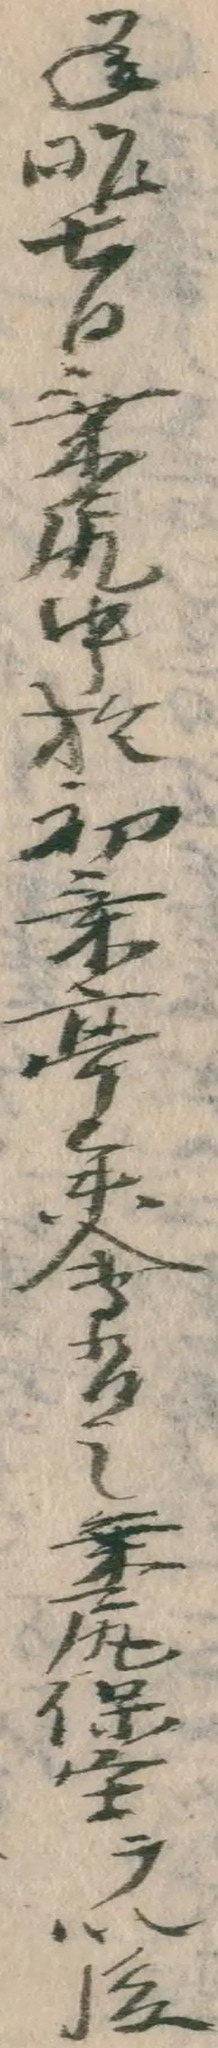承昨七日乗尻中於初乗亭参會有之乗尻保守ヲ以後
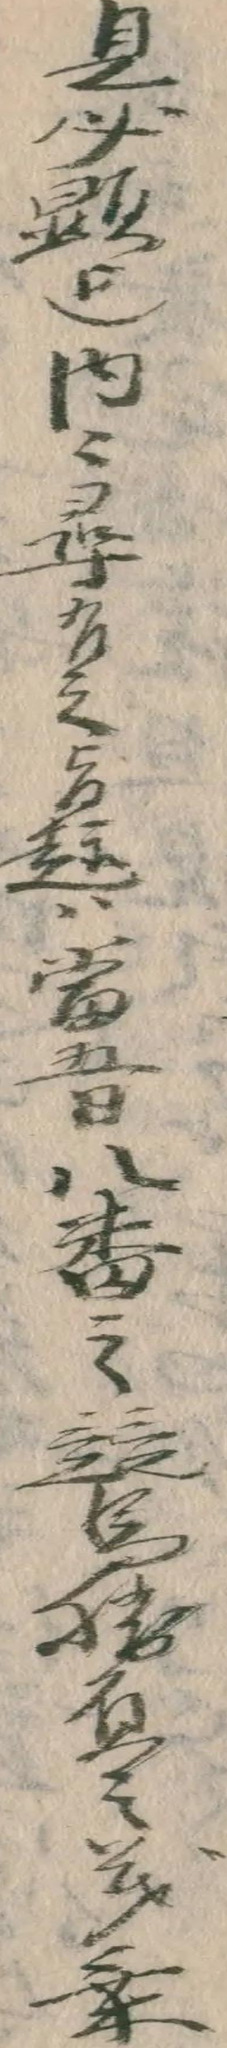息必顕迄内々尋有之旨趣ハ當五日八番之競馬勝負之義乗
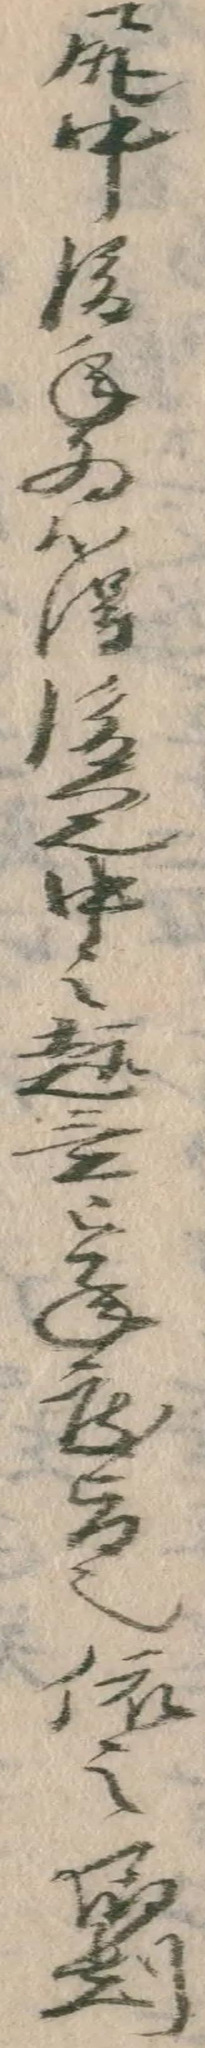尻中後年為心得後見中之趣意被承度旨也依之即刻
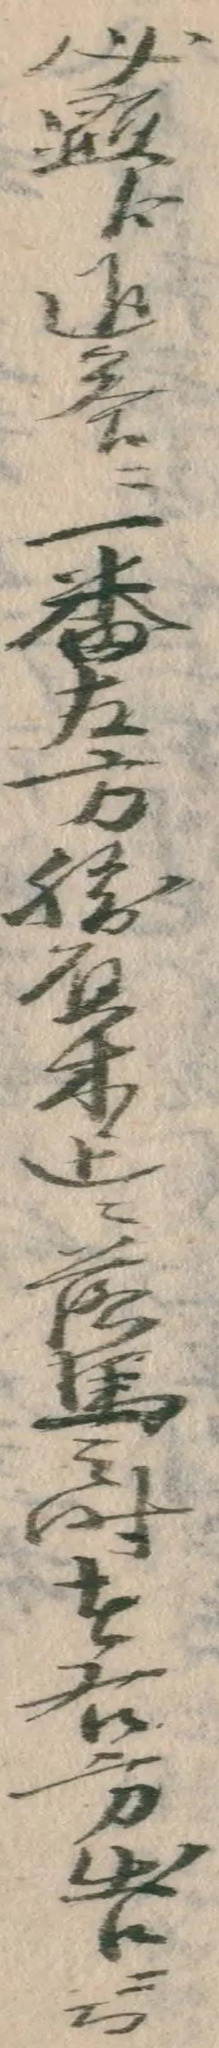必顕ゟ返答ニ一番左方勝負木迄ニ落馬之時者右方出口ニ而
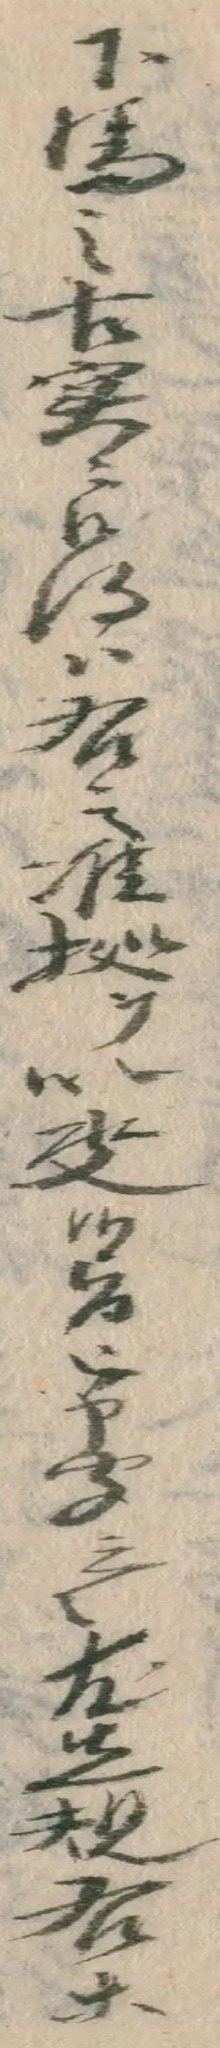下馬之古実ニ候得ハ右之准拠ヲ以決候旨被申聞云々尤先規右等
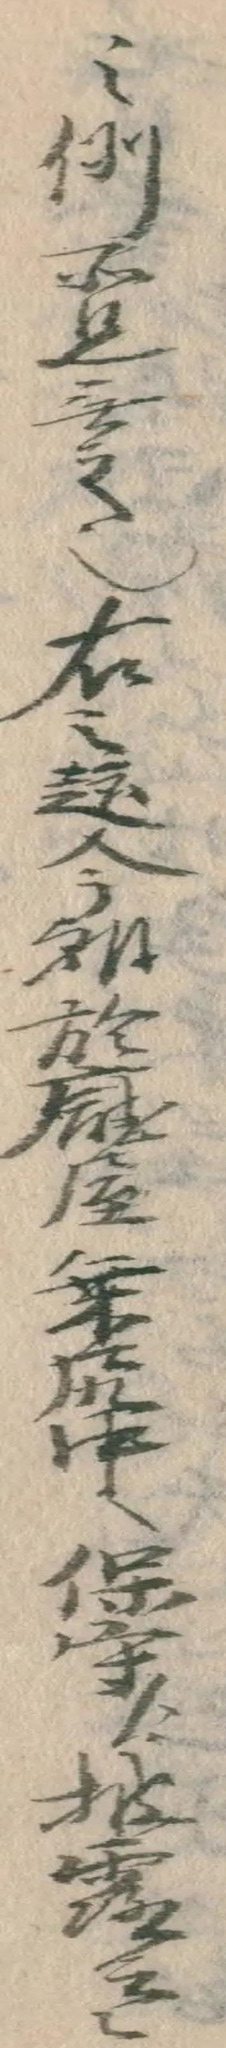之例所見無之也右之趣今朝於廰屋乗尻中へ保守ゟ披露云々
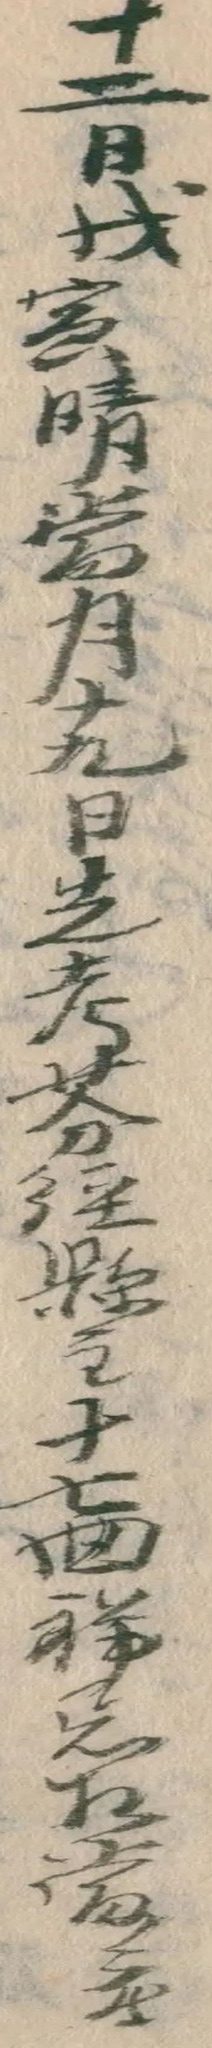十二日戊寅晴當月十九日先考芬経縣主十七回祥忌相當ニ付
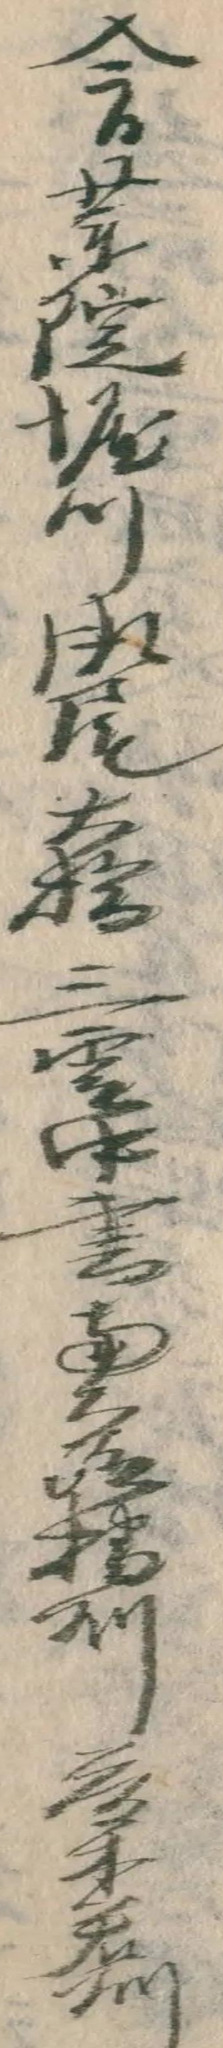今日薬院堀川瀬尾大橋三雲中書南大通播州藤木若州
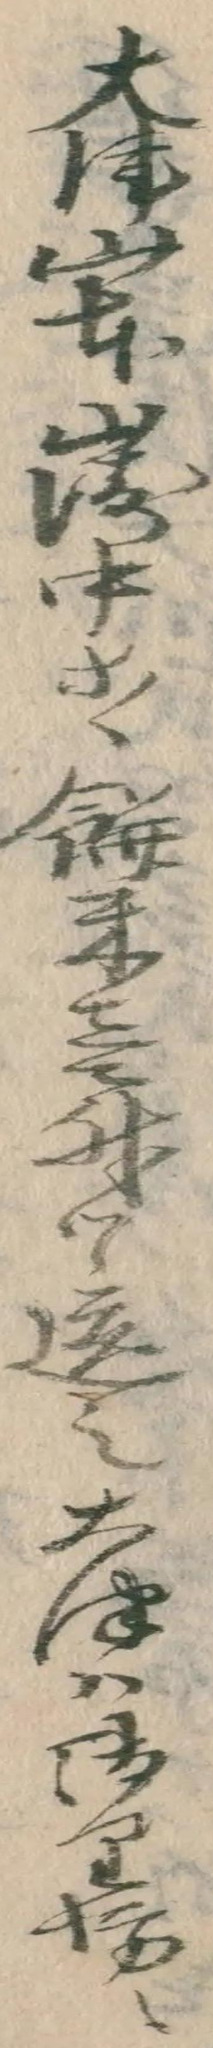大津山本山崎中等御餅米壱升ツヽ送之大津ハ御聡坊二
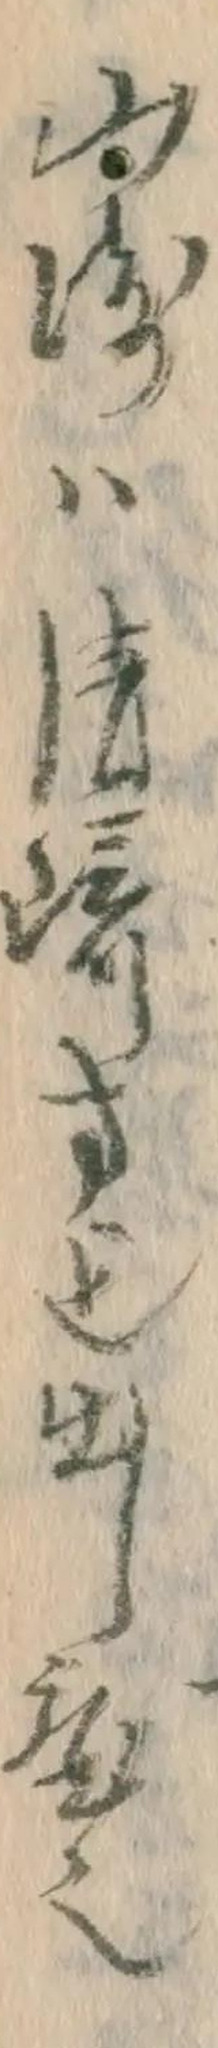山崎ハ清崎方迄出し置也

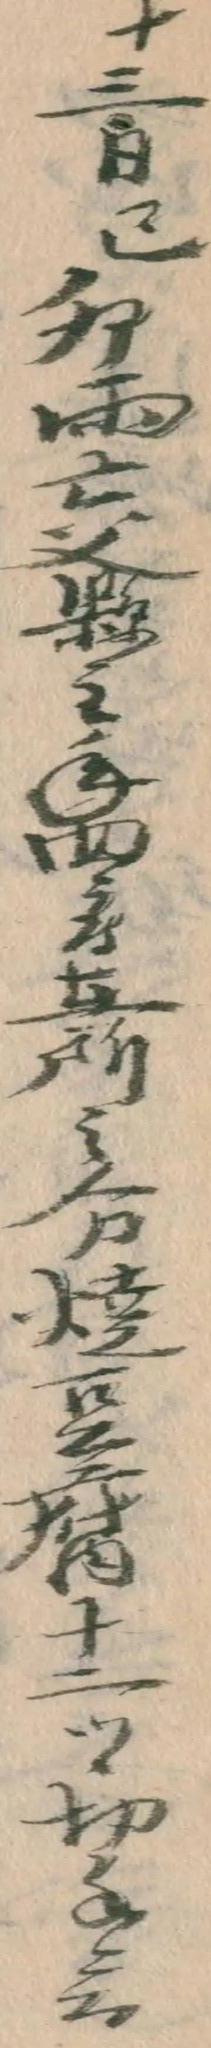十三月己卯雨亡父縣主年回ニ付在所之分焼豆腐十二ツヽ切手ニ而
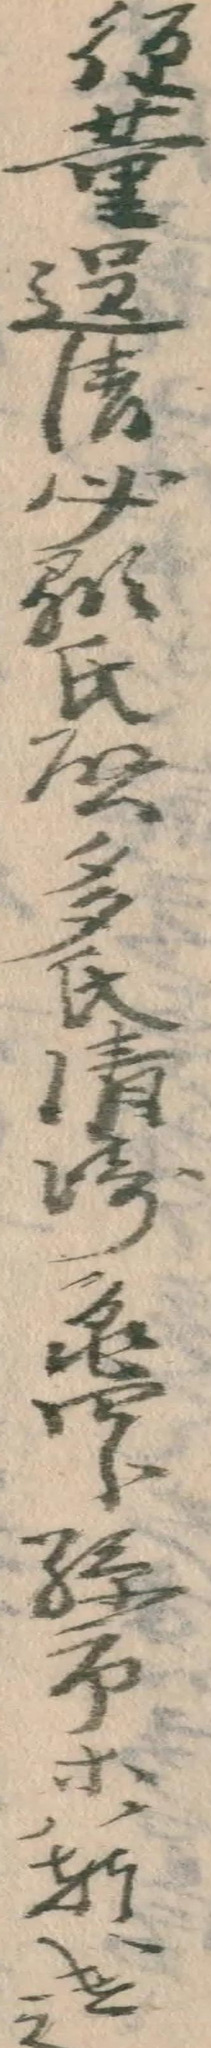経董逞清必顕氏啓多氏清崎亀四郎孫市等八軒へ遣之
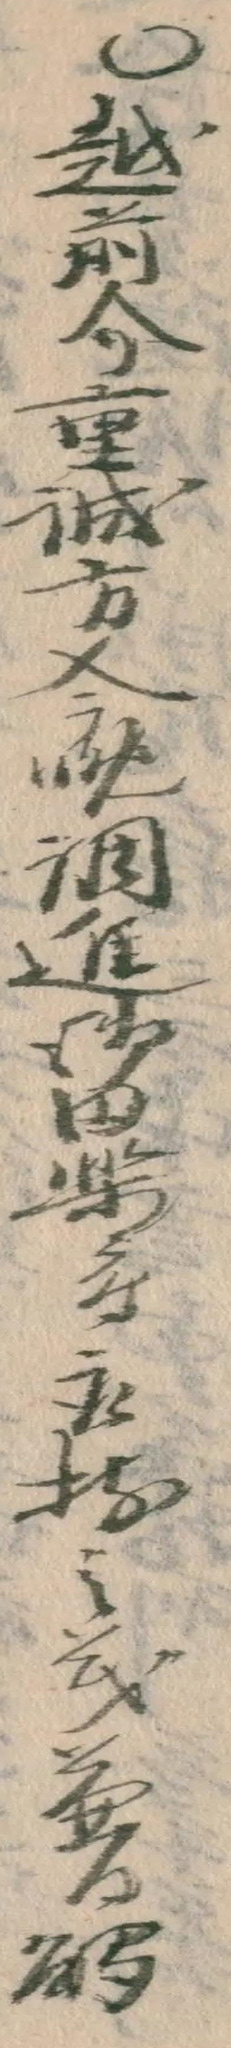○越前介重誠方今晩調進御田楽ニ付取持之義兼日觸
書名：賀茂社記録. 第69冊
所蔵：国立国会図書館 National Diet Library, JAPAN
